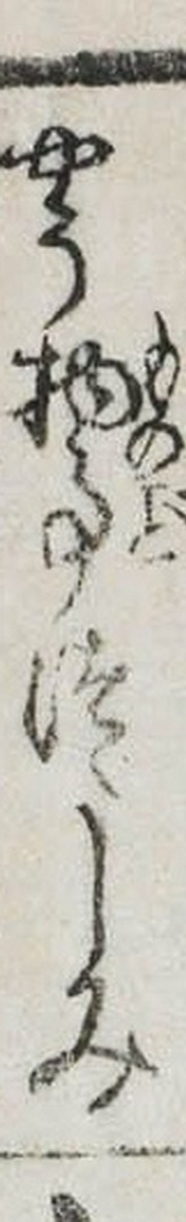やう物事つゝしみ
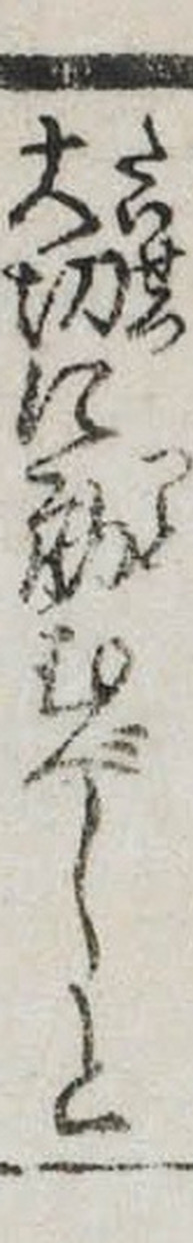大切に勤むべしと
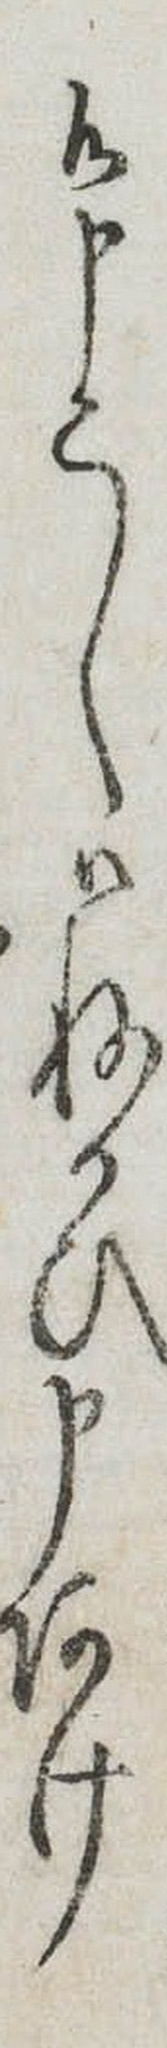御申こし御ねかひ申あけ
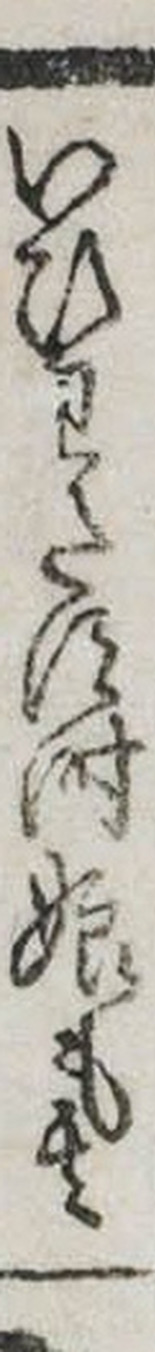いひわたす時娘も其
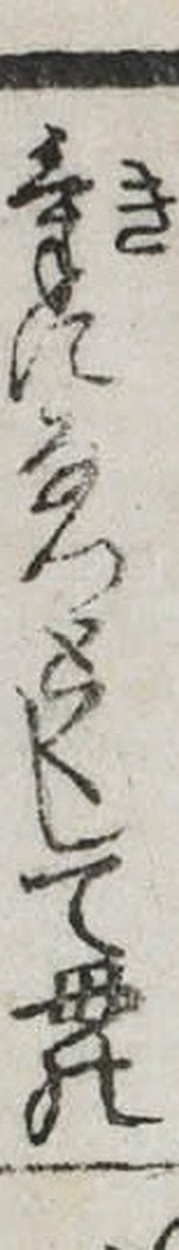気になつとくして母の
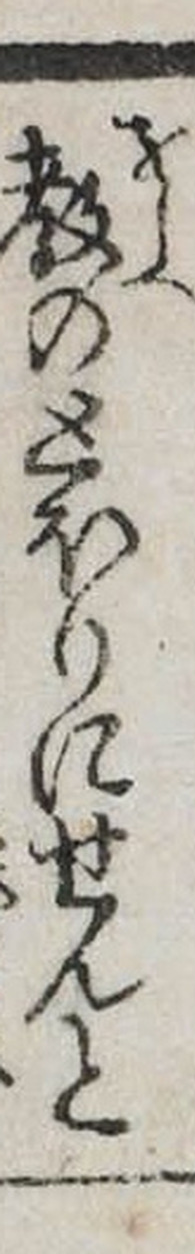教のとほりにせんと
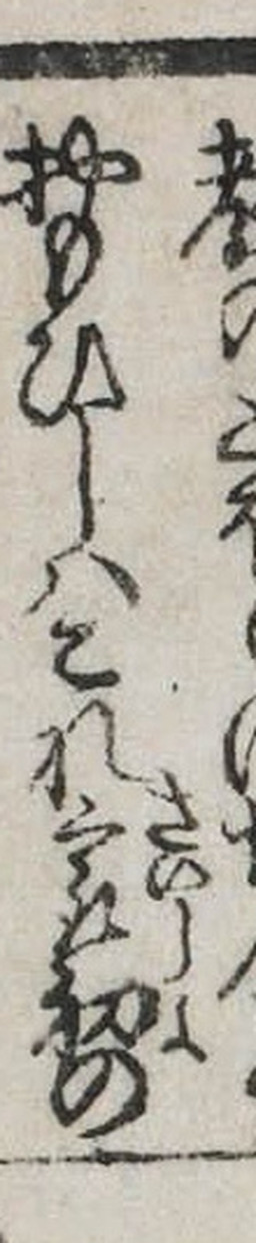おもひしはこれ最初の
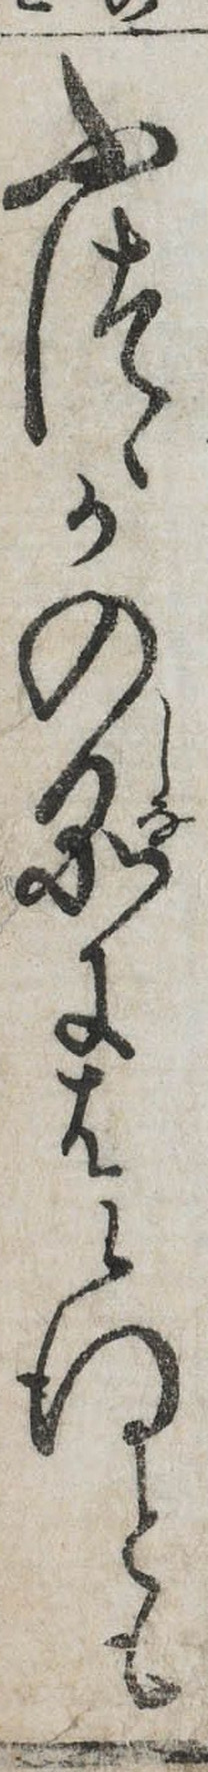ふつゝかの品には候得とも
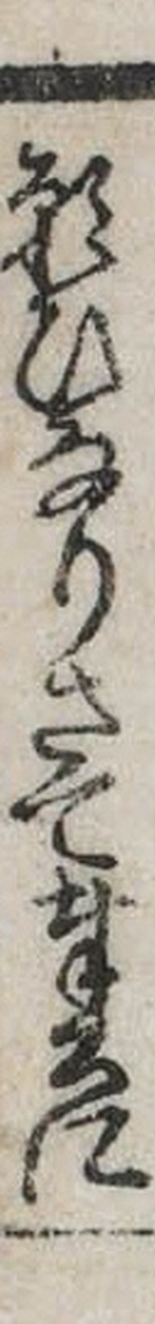願ひなりさて奉公に

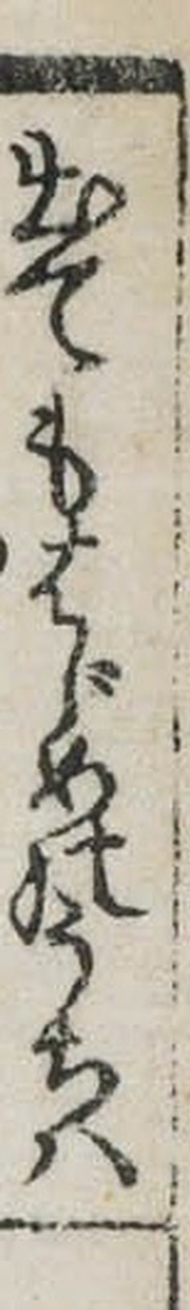出てもはじめのうちは
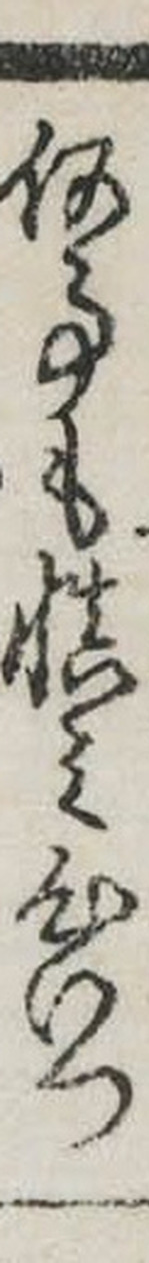何事も慎み心いつ
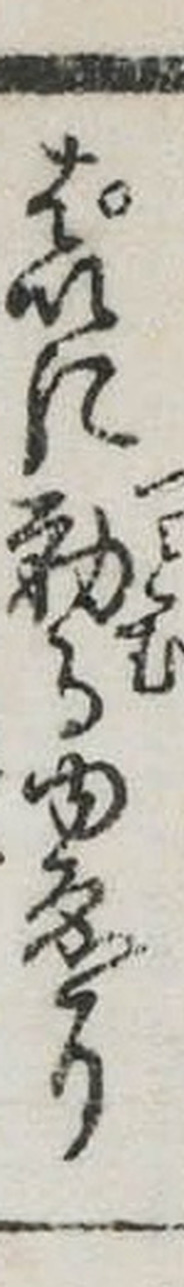ぱいに勤るゆゑに
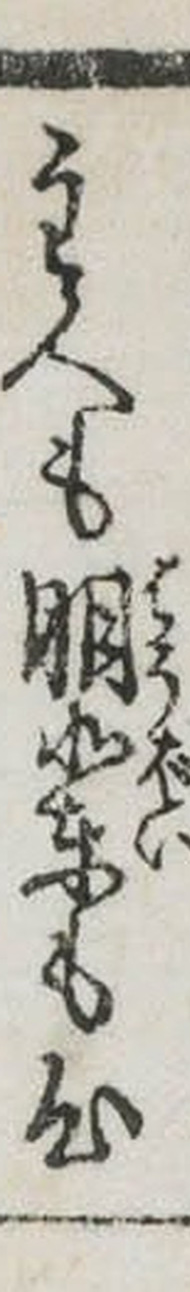主人も朋輩も心
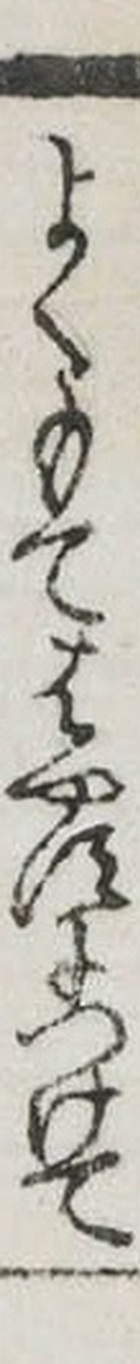よくもてはやすにつけて
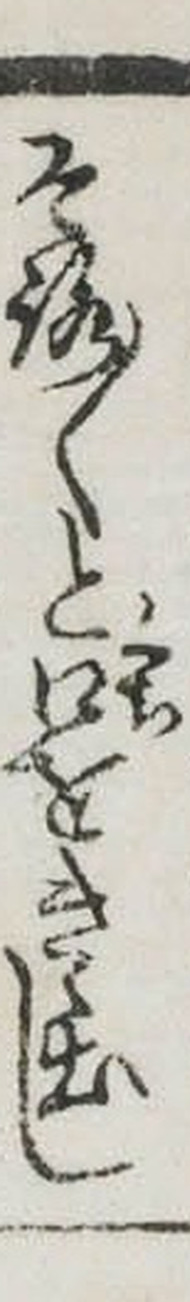そろ〳〵と口をきゝ出し
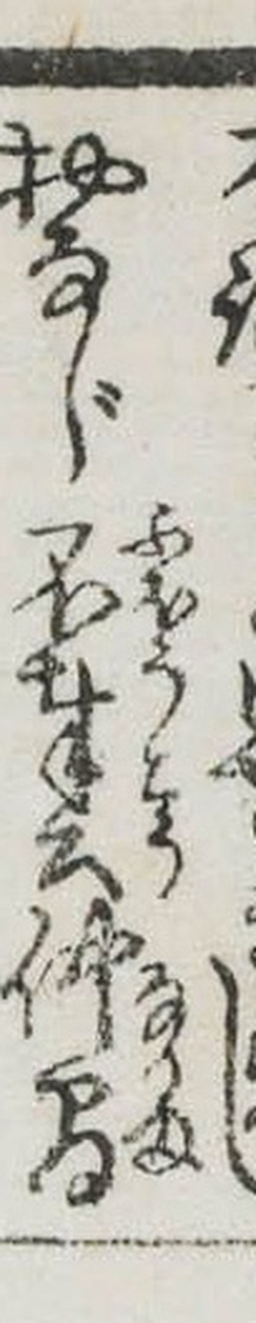おなじ不奉公仲間
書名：頭書萬用婦人手紙之文言
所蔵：東京学芸大学教育コンテンツアーカイブ
